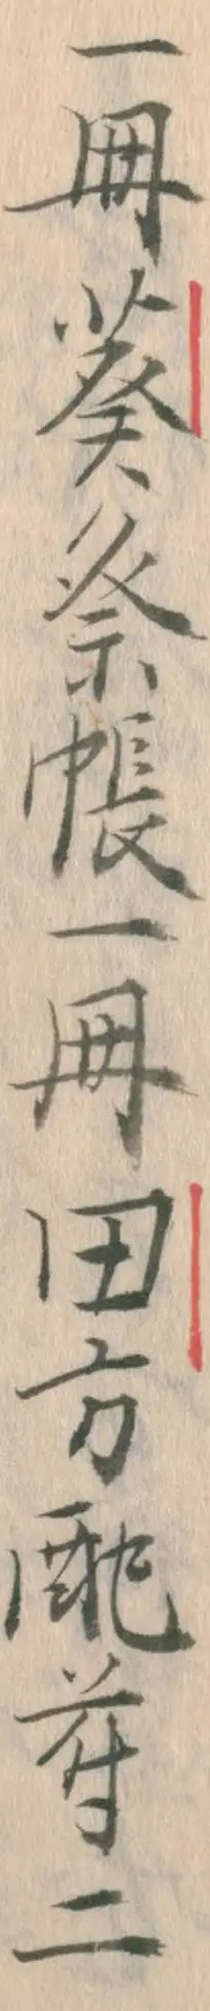一冊葵祭帳一冊田方配符二
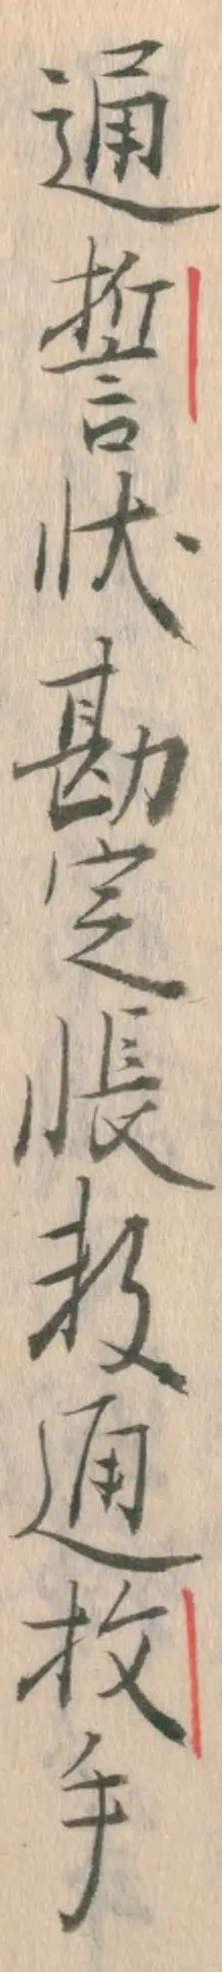通誓状勘定帳数通枚手
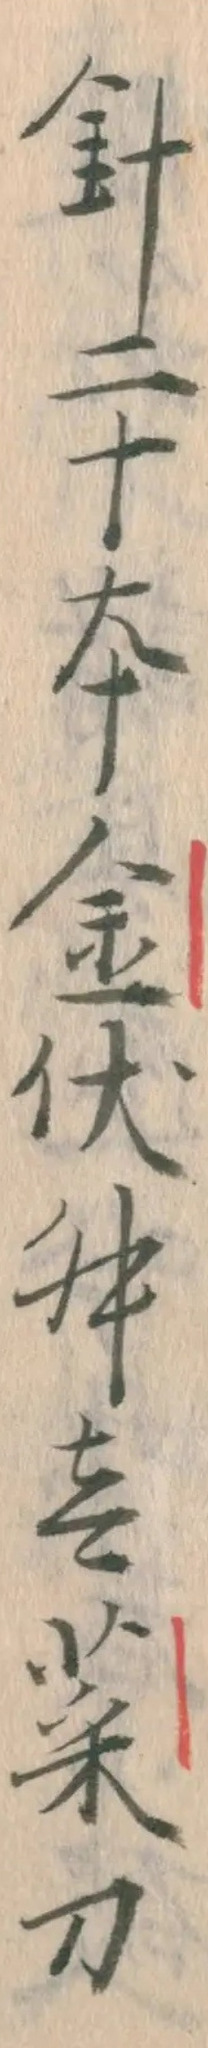針二十本金伏升壱菜刀
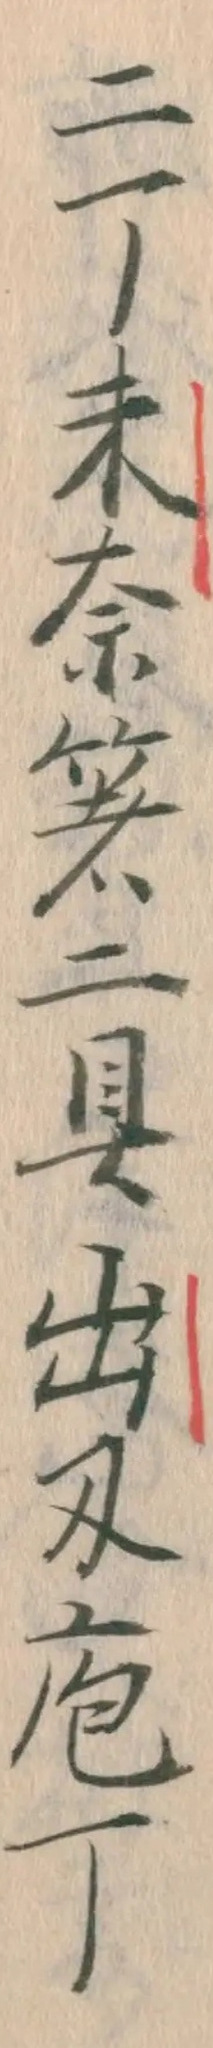二丁未奈箸二具出刃包丁
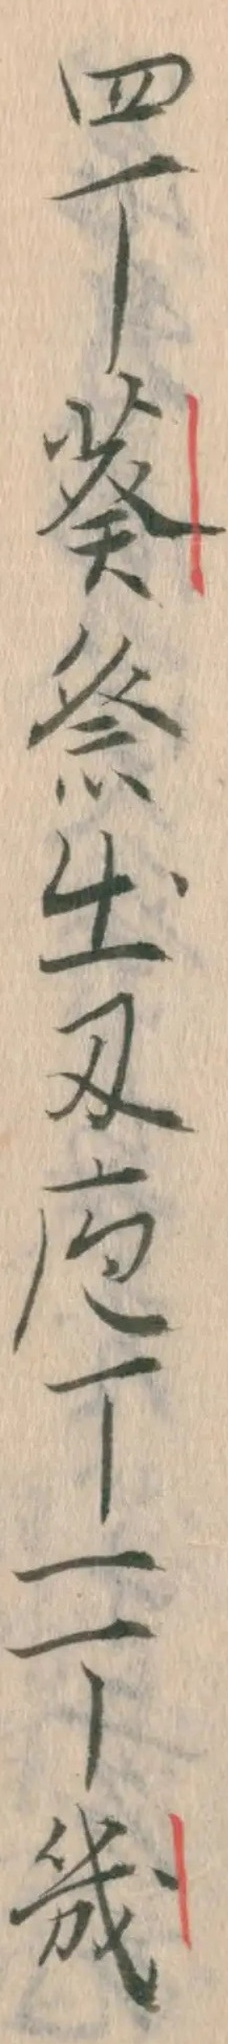四丁葵祭出刃包丁一丁幾
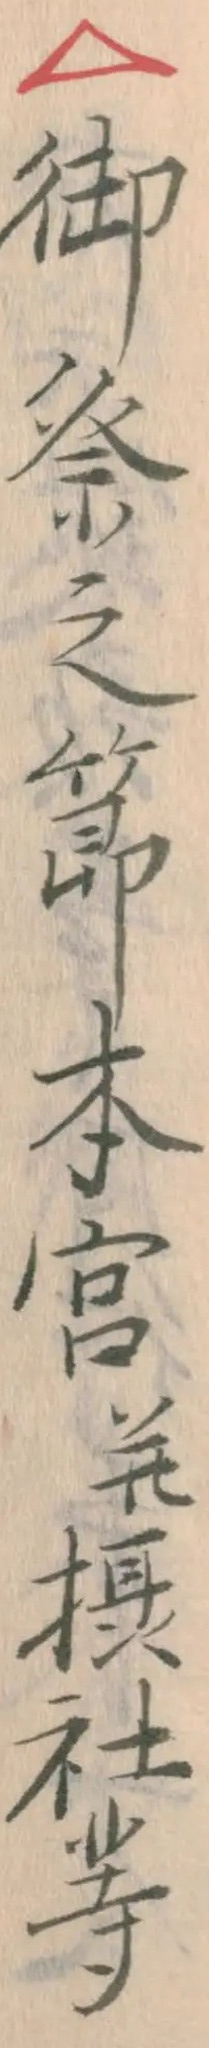△御祭之節本宮并摂社等
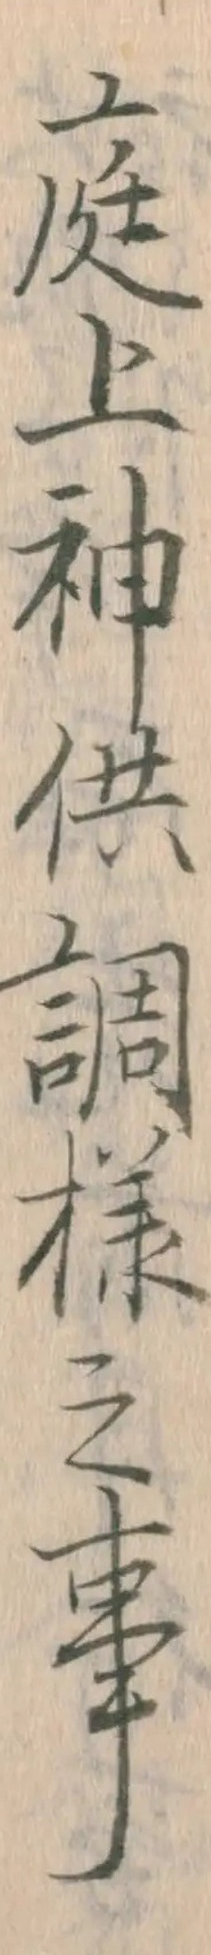庭上神供調様之事
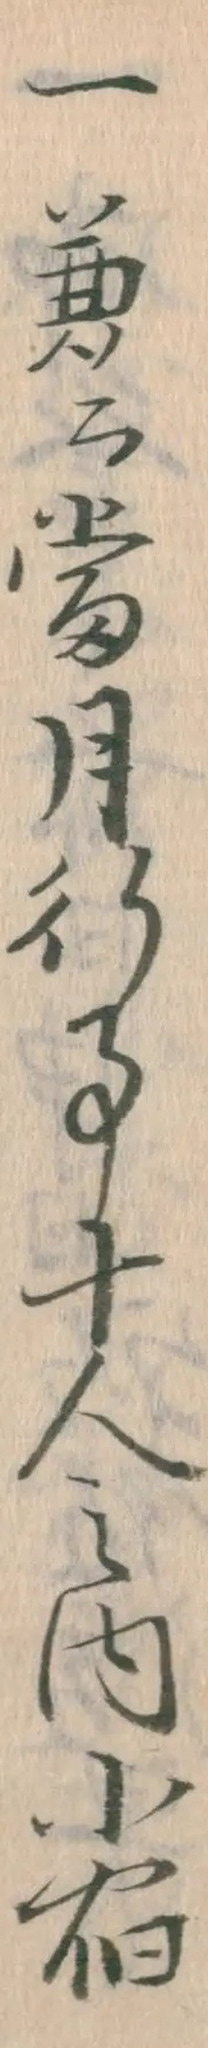一兼而当月行事十人之内小宿
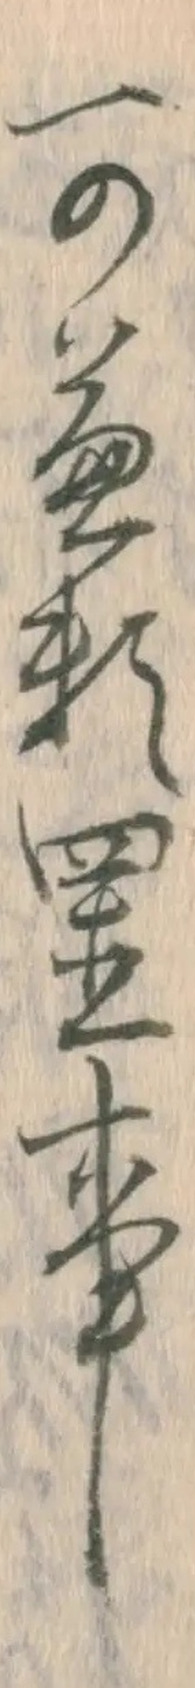可兼頼置事
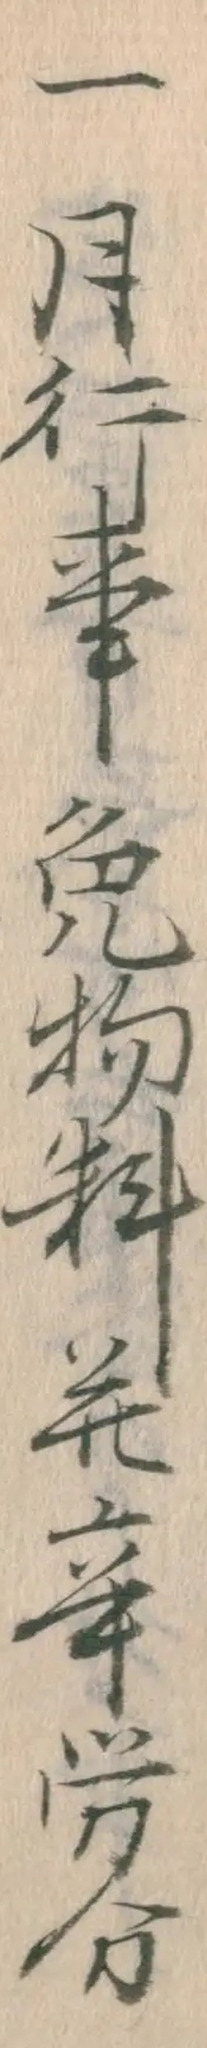一月行事免物料并辛労分
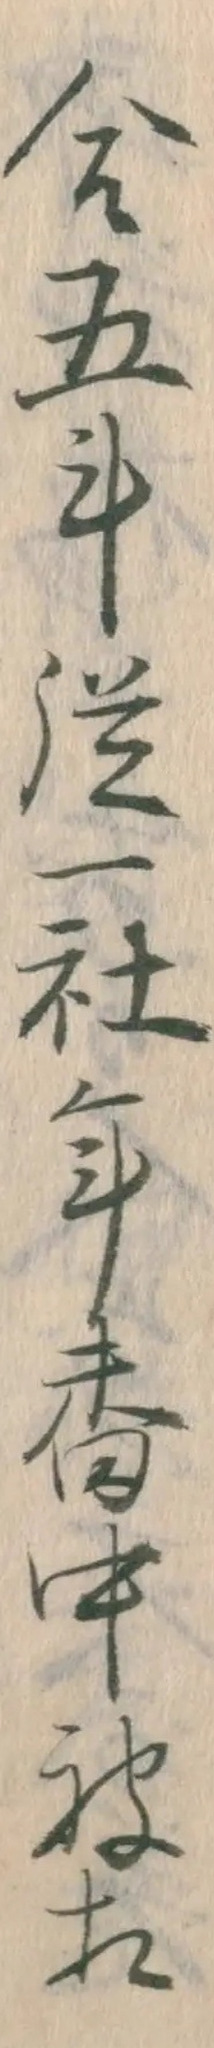合五斗従一社年番中被相
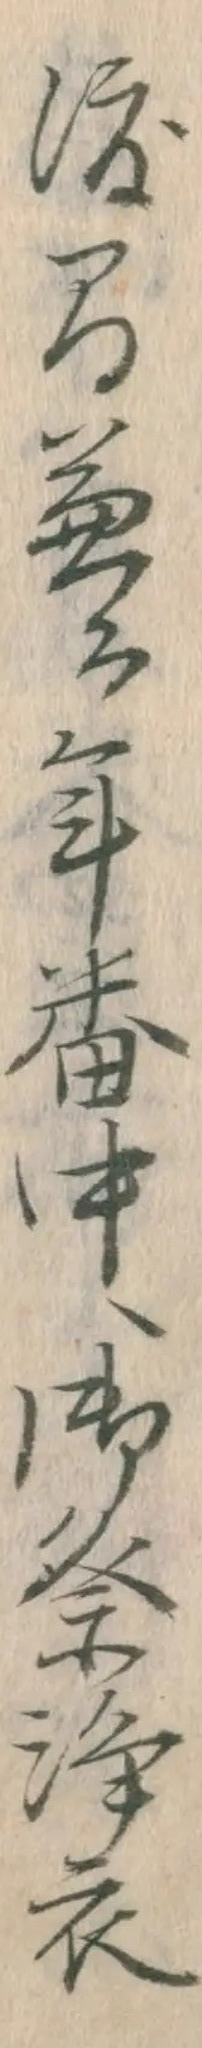渡間兼而年番中へ御祭浄衣
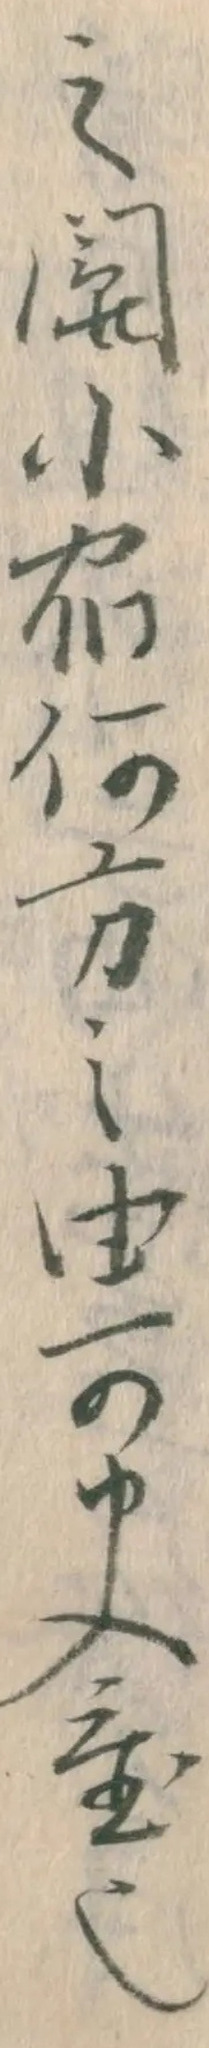之鬮小宿何方之由可申入置也
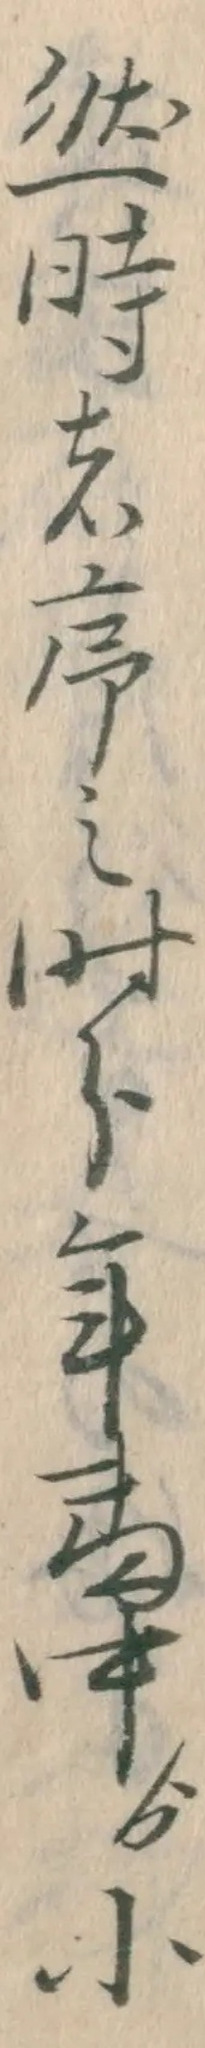然時者序之時分年番中ゟ小
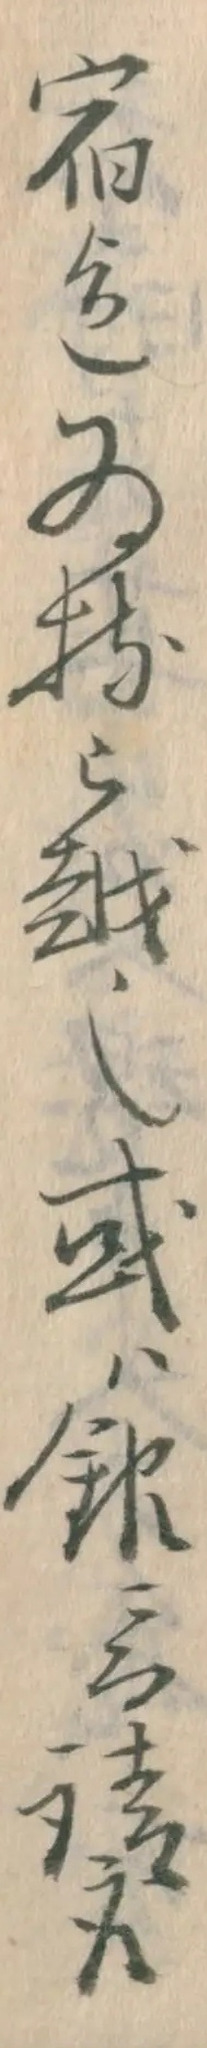宿迄為持被越也或は銀に而請取

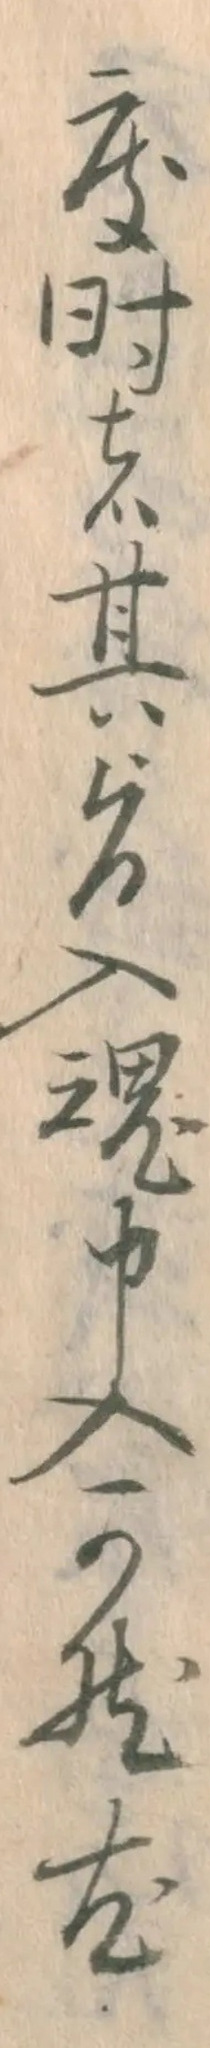度時者其旨入魂申入可然尤
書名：賀茂社記録. 第81冊
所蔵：国立国会図書館 National Diet Library, JAPAN
